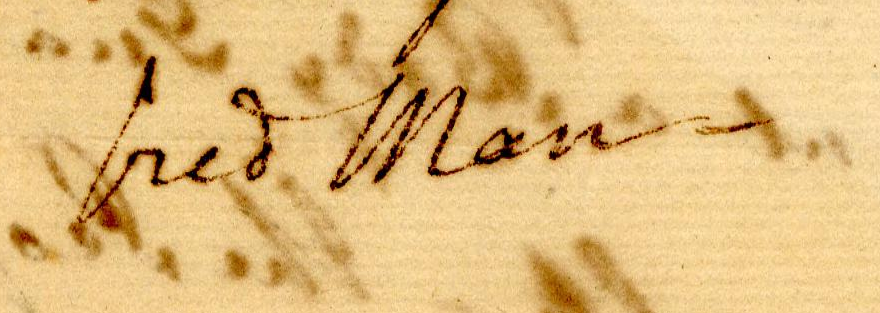bred Man-
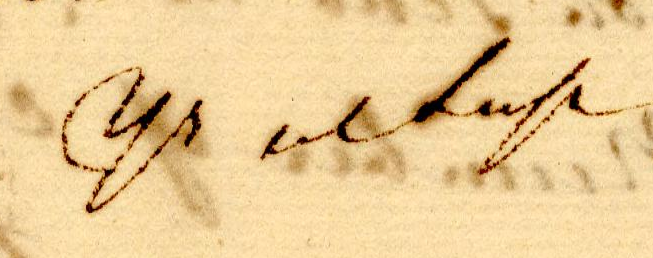Y^r always
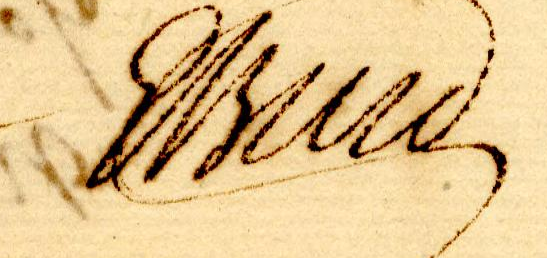E Burd
